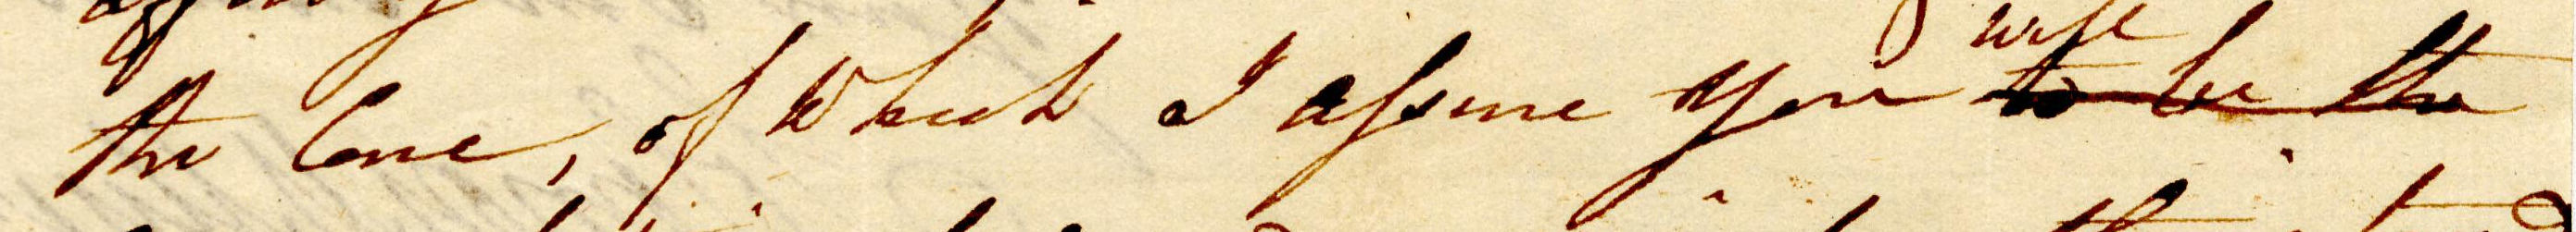the Case, of which I assure you [to be the]
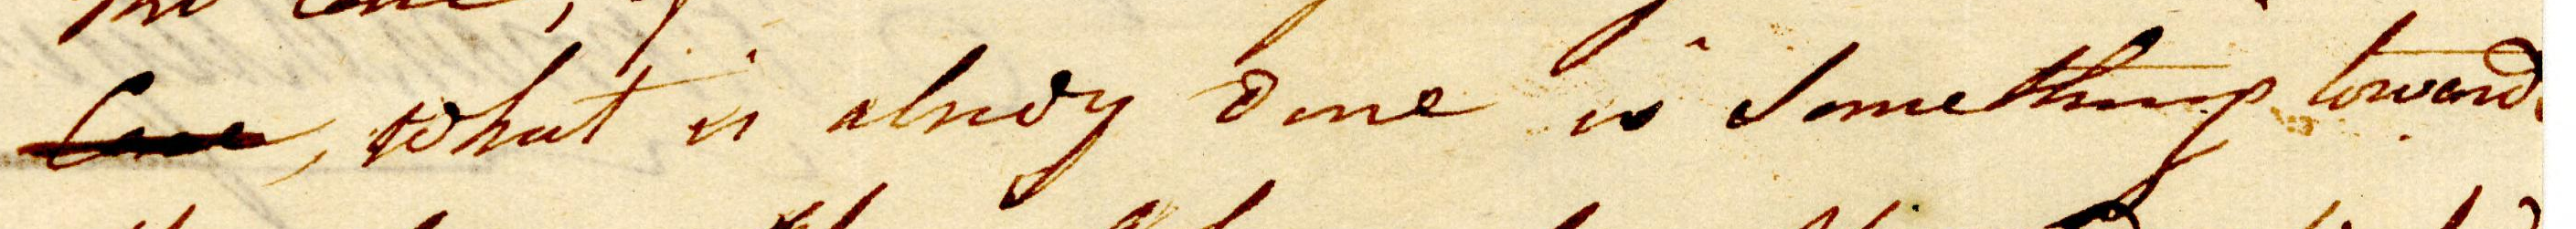[Case], what is already done is something toward
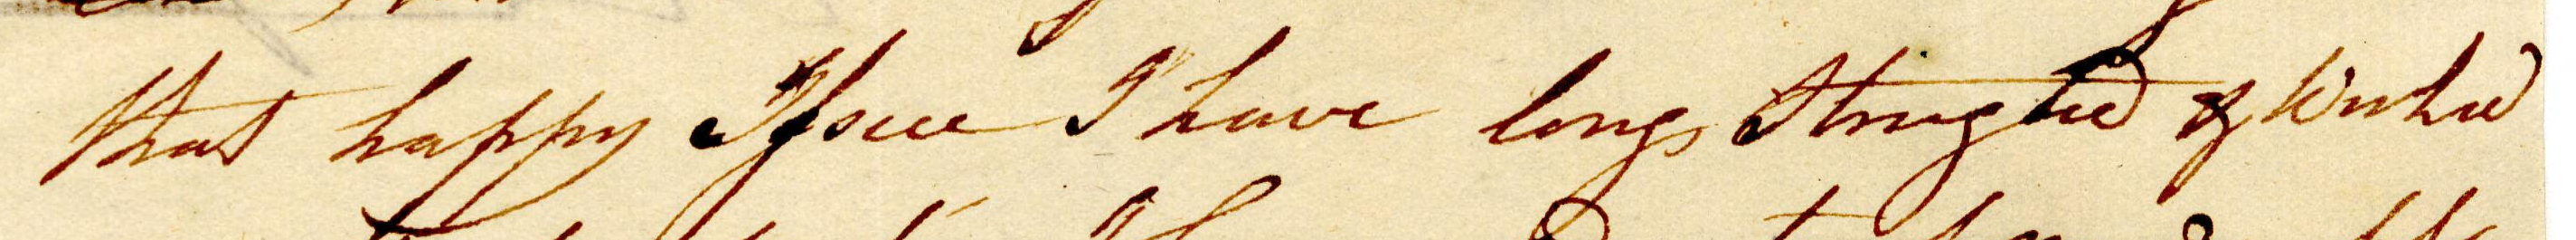that happy Issue I have long strugled & worked
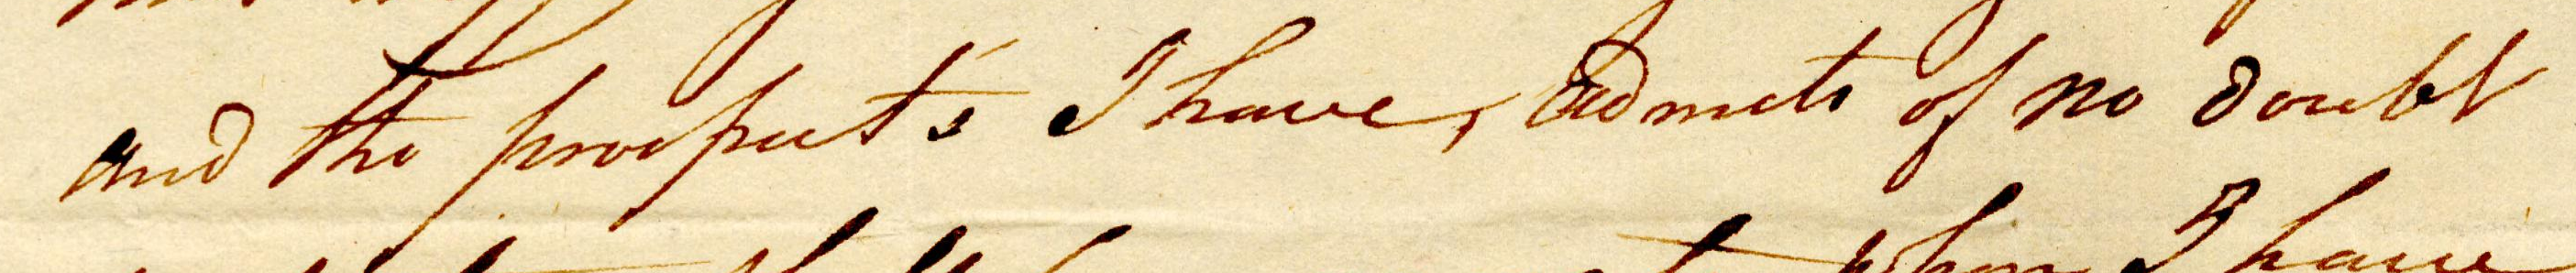and the prospects I have, admits of no doubt
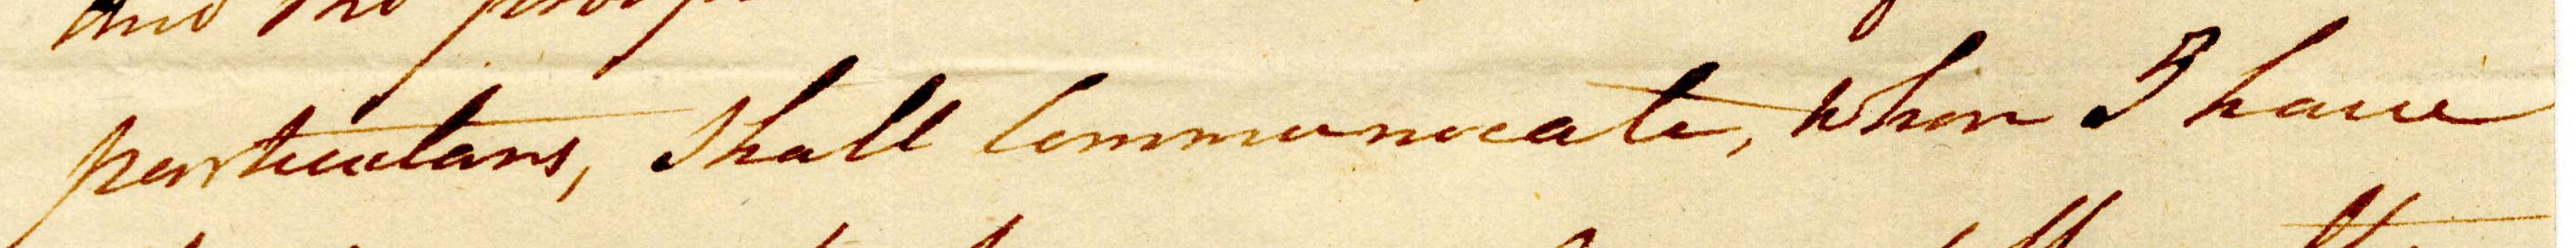particulars, shall communicate, when I have
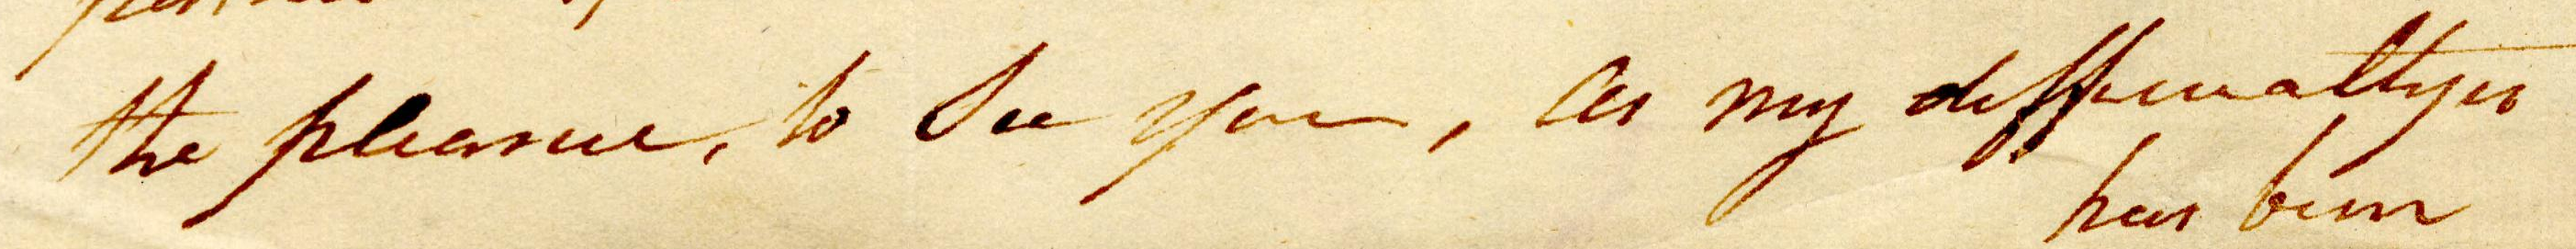the pleasure, to see you, as my difficualtyes
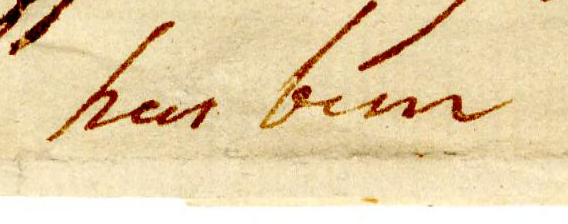has been
